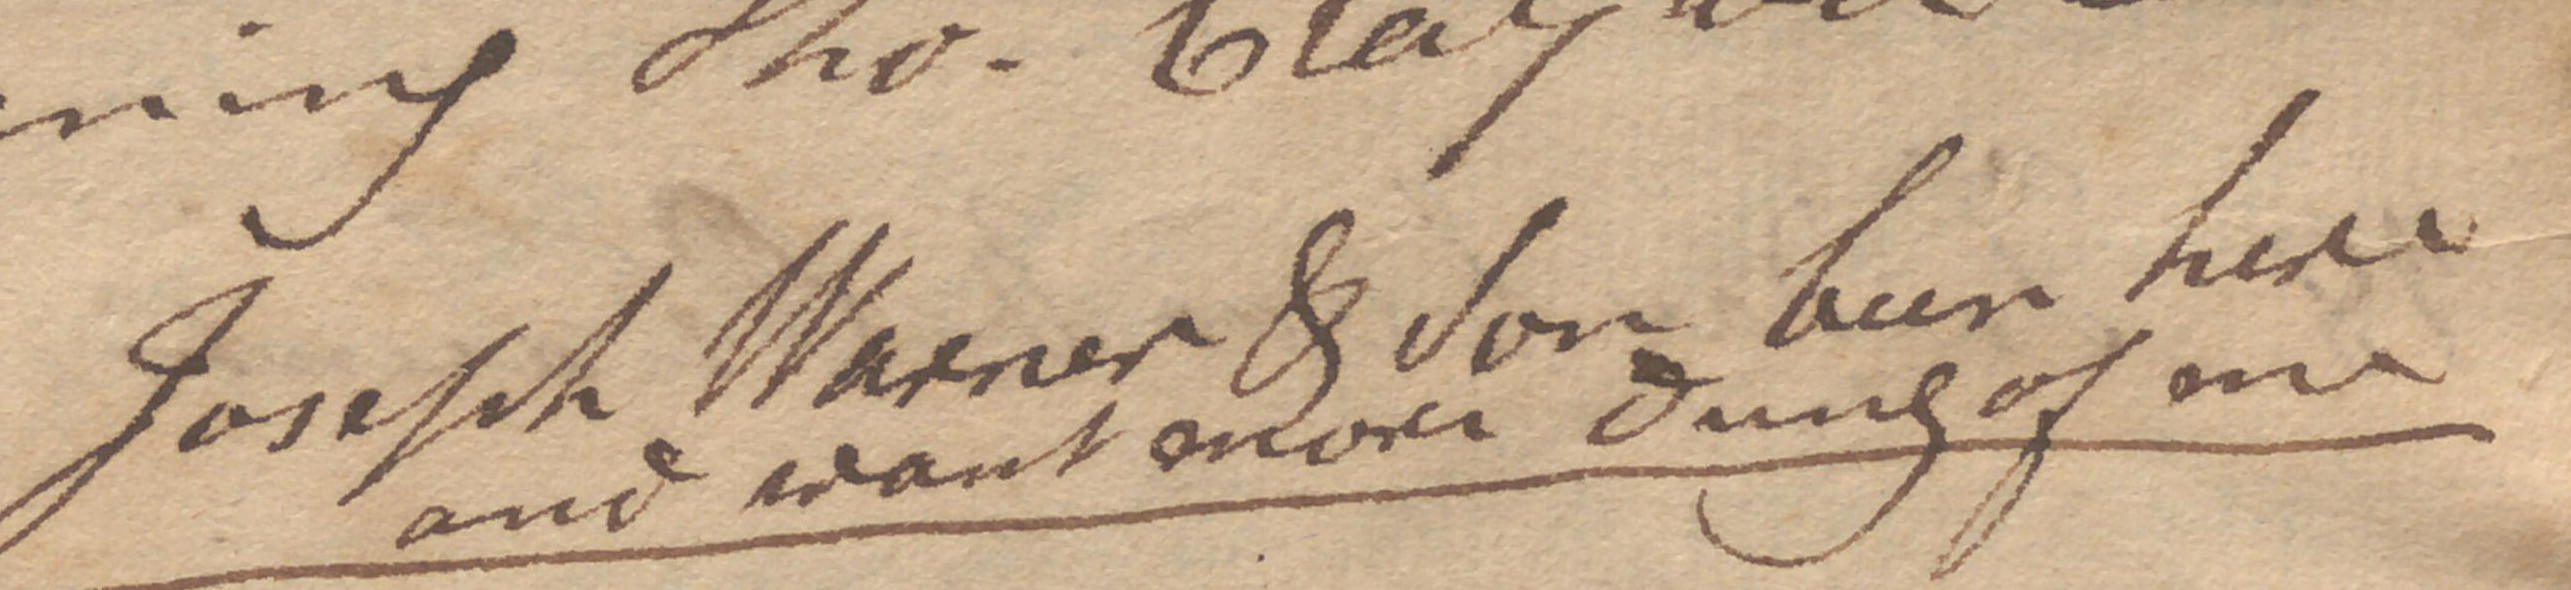Joseph Warner & Son been here
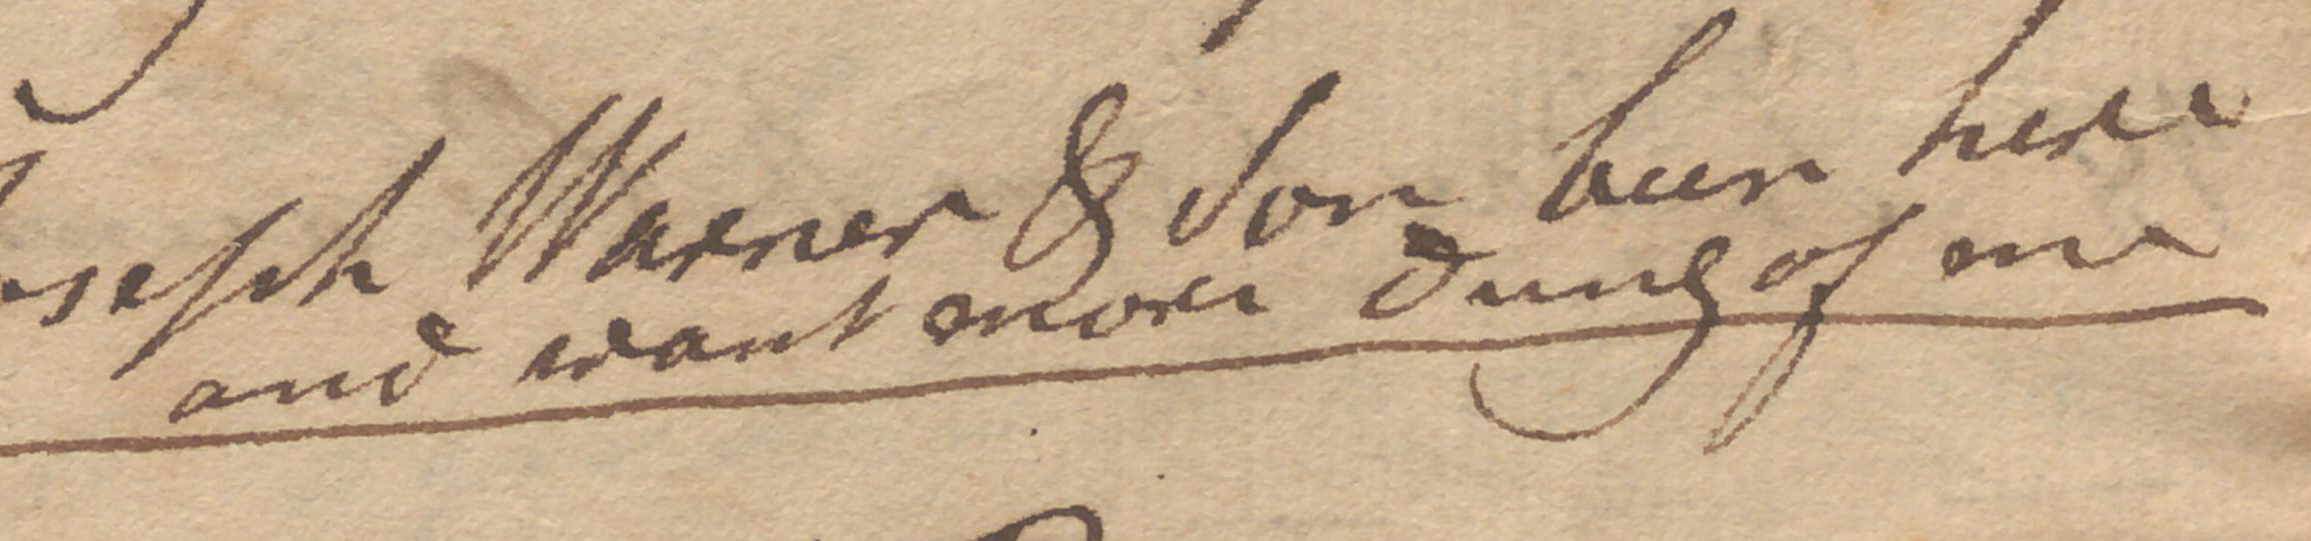and want more dung of one
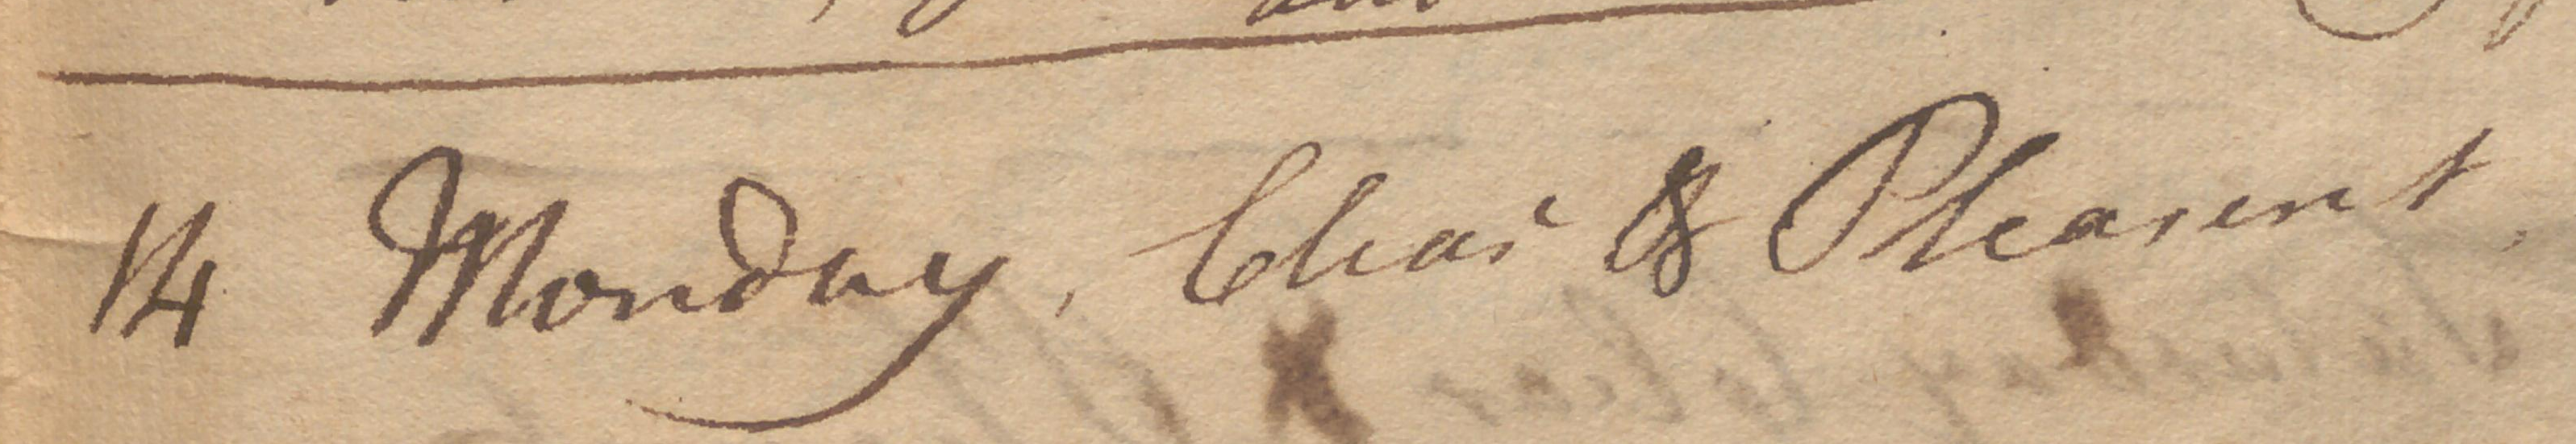14 Monday. Clear & Pleasent
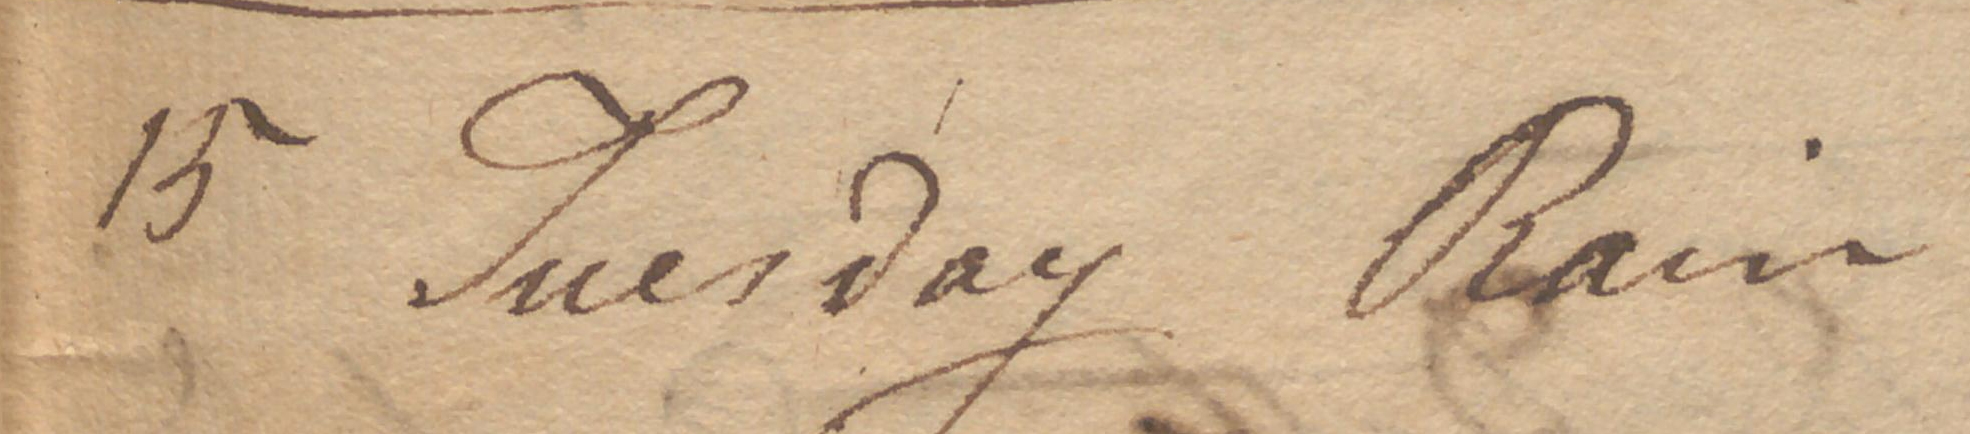15 Tuesday Rain
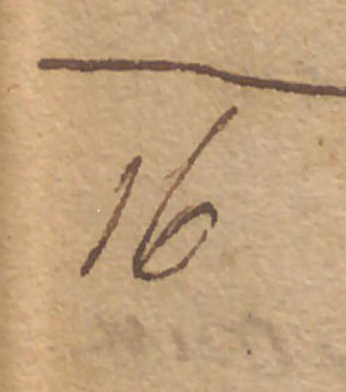16
